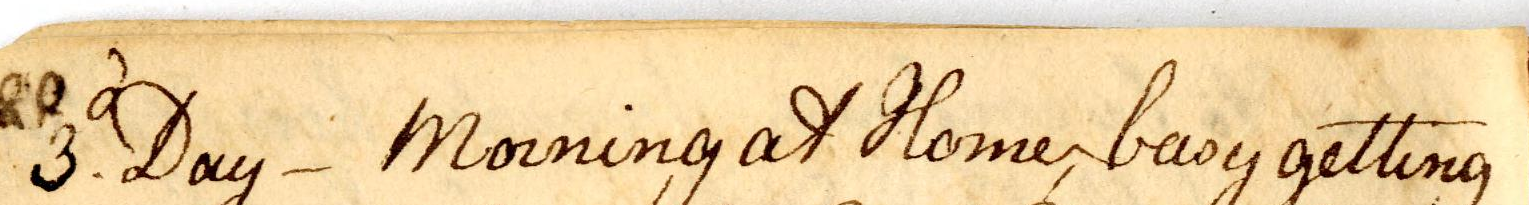3^d Day- Morning at Home, busy getting
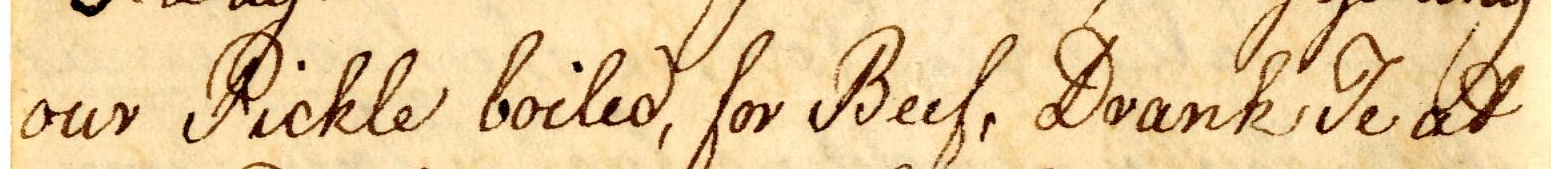our Pickle boiled, for Beef, Drank Te at
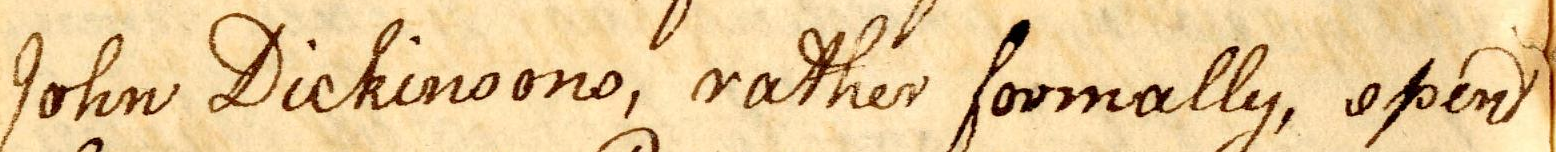John Dickinsons, rather formally, spent
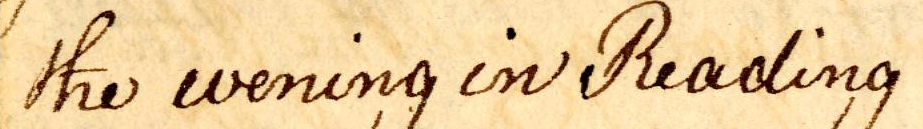the evening in Reading
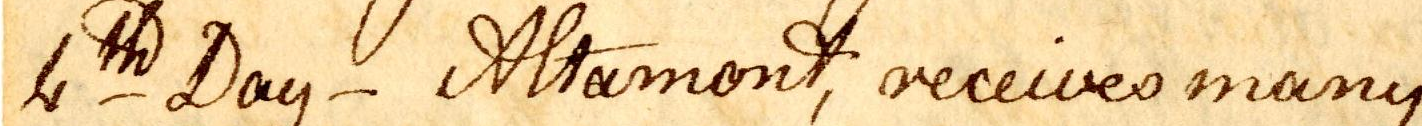4^th Day- Altamont, receives many
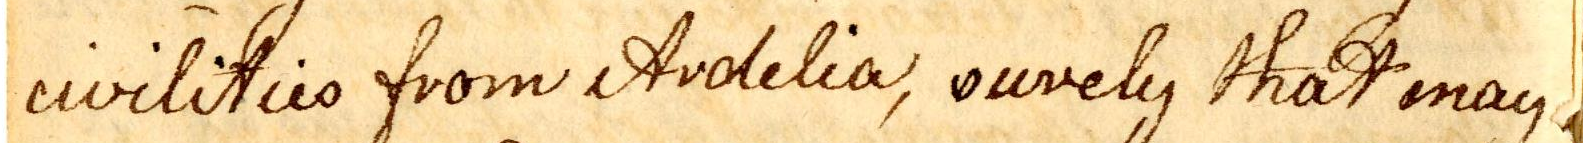civilities from Ardelia, surely that may
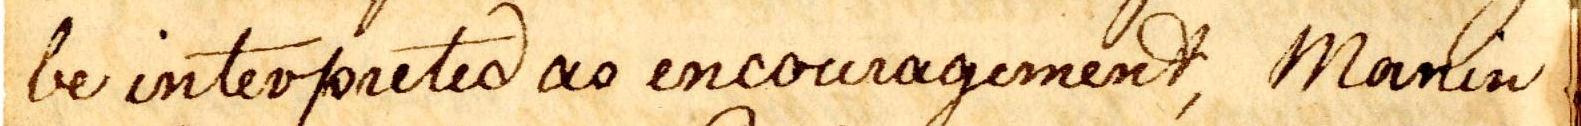be interpreted as encouragement, Mania
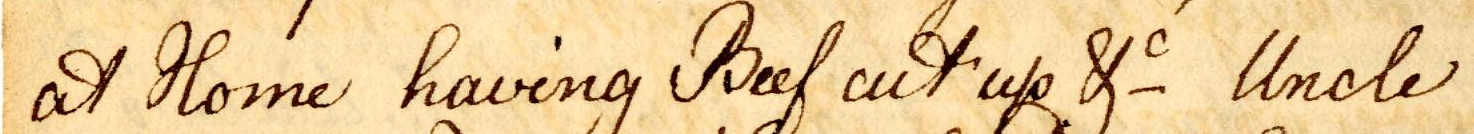at Home having Beef cut up &^c Uncle
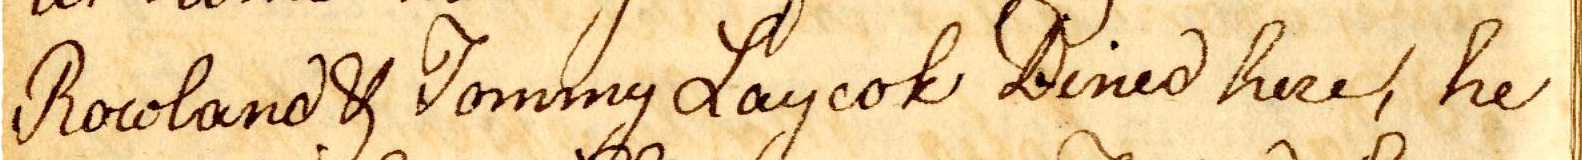Rowland & Tommy Laycok Dined here, he
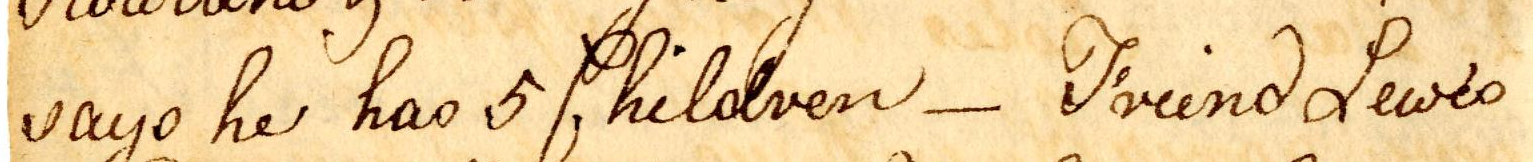says he has 5 Children- Friend Lewis
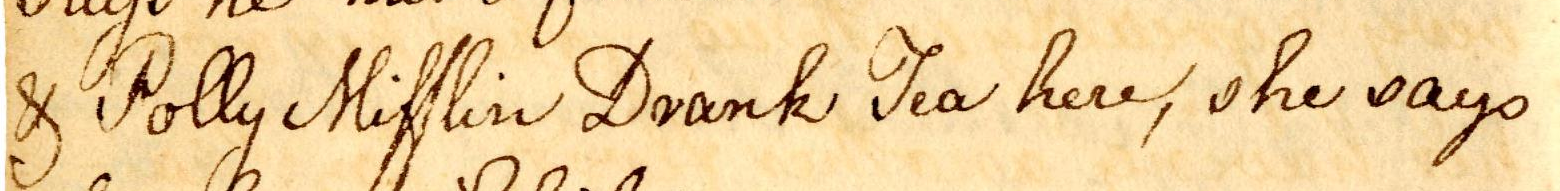& Polly Mifflin Drank Tea here, she says
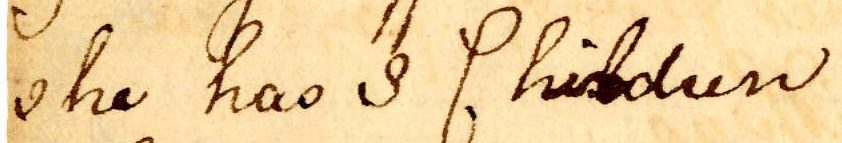she has 3 Children
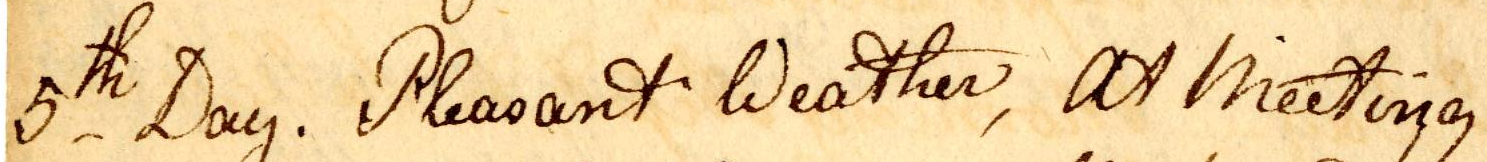5^th Day. Pleasant Weather, At Meeting
